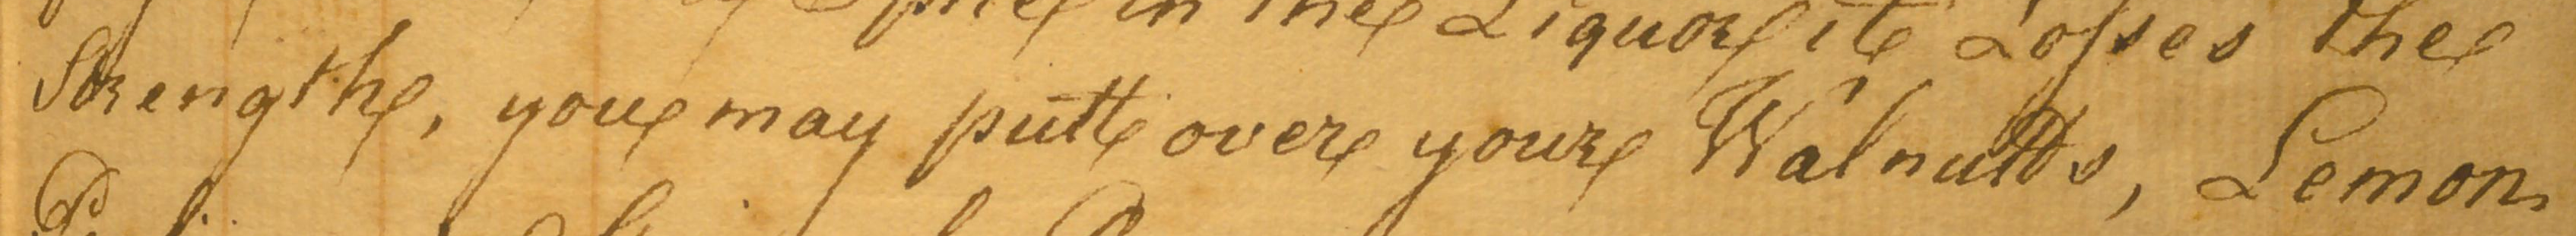Strength, you may putt over your Walnutts, lemon
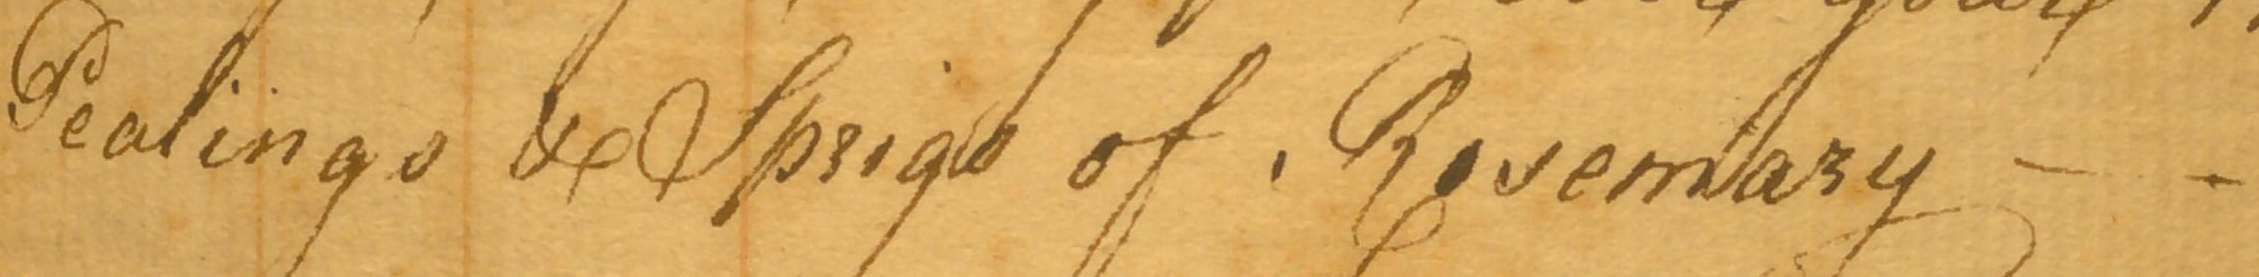Pealings & Sprigs of Rosemary--
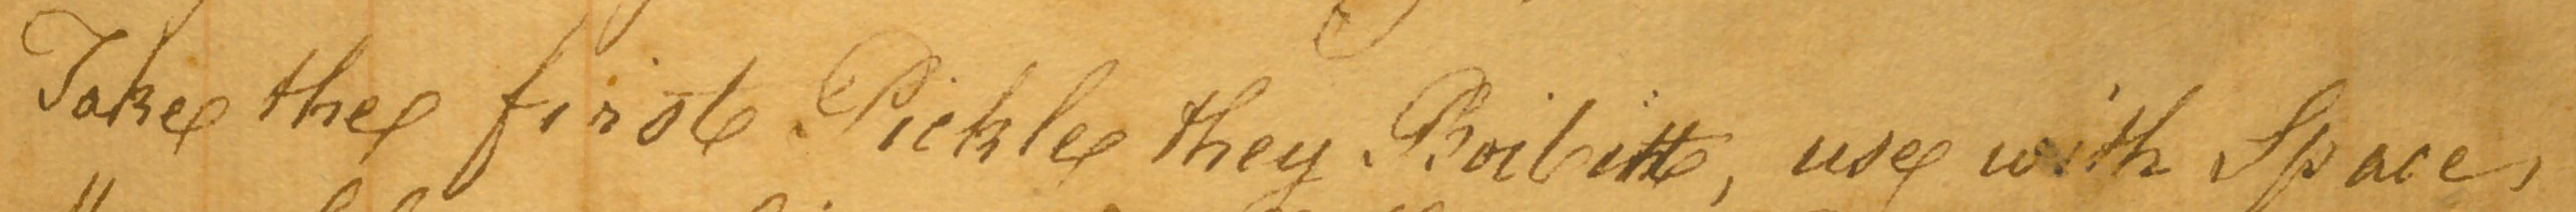Take the first Pickle they Boil itt, use with Space,
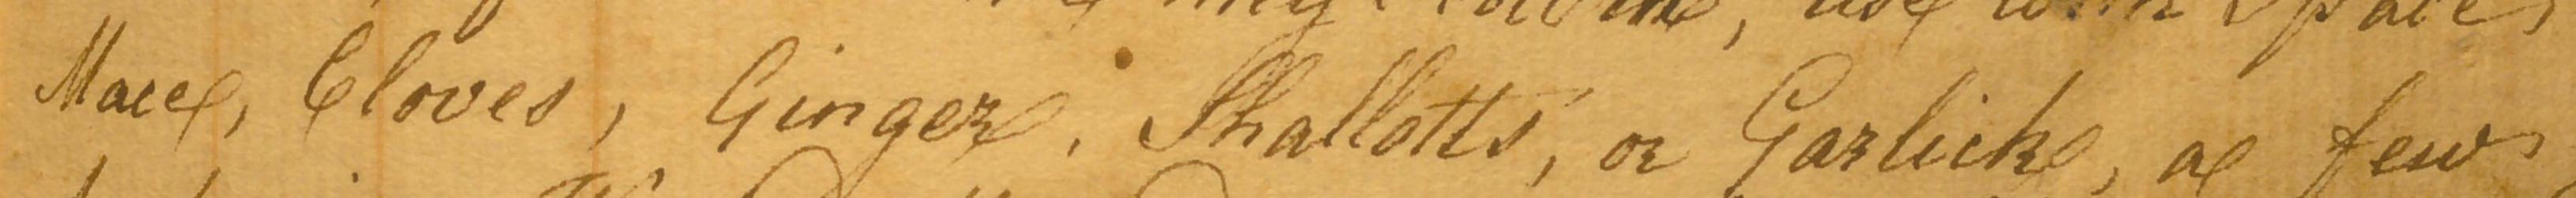Mace, Cloves, Ginger, Shallotts, or Garlick, a few
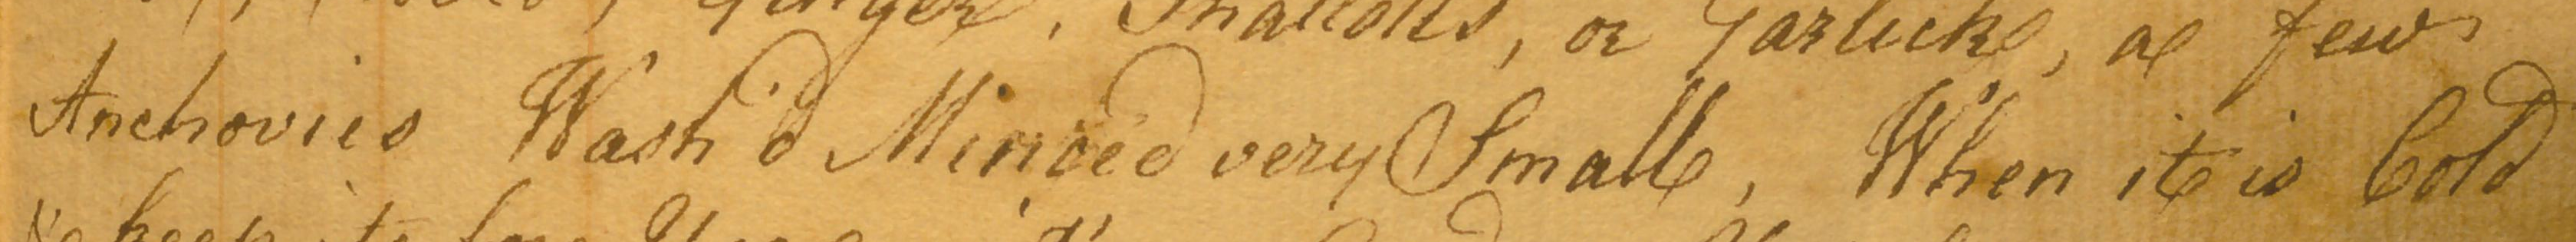Anchovies Wash'd Minced very small, When it is Cold
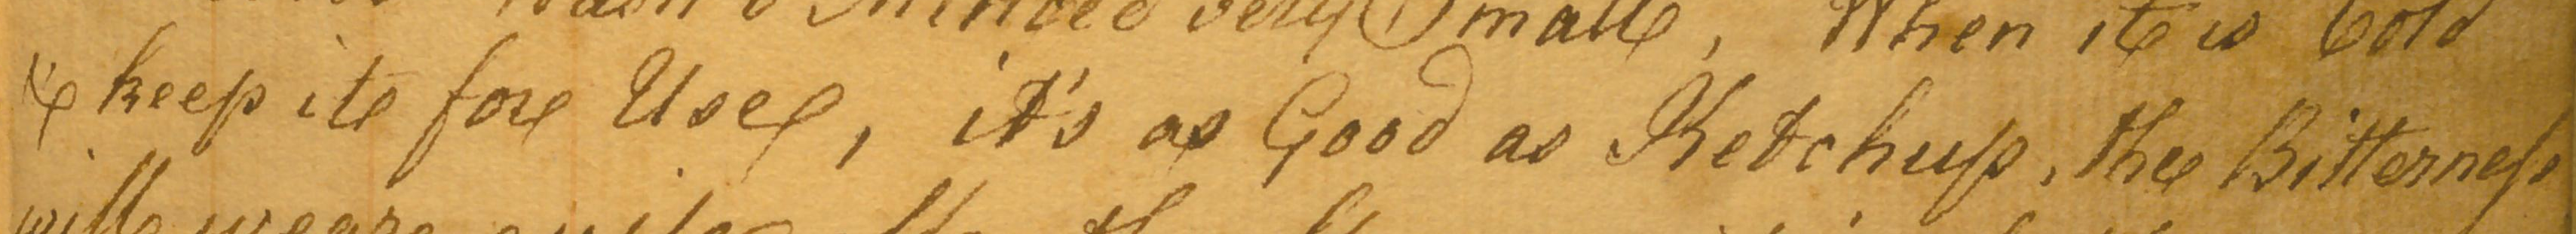& keep it for Use, it's as Good as Ketchup, the Bitterness
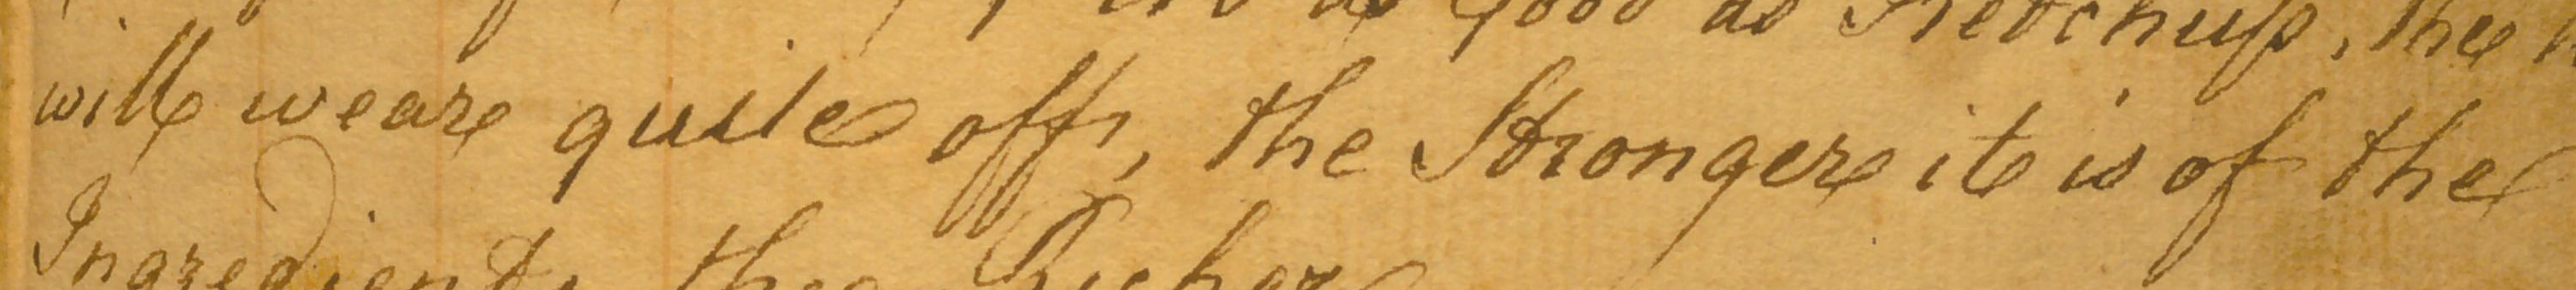will wear quite off, the strong it is of the
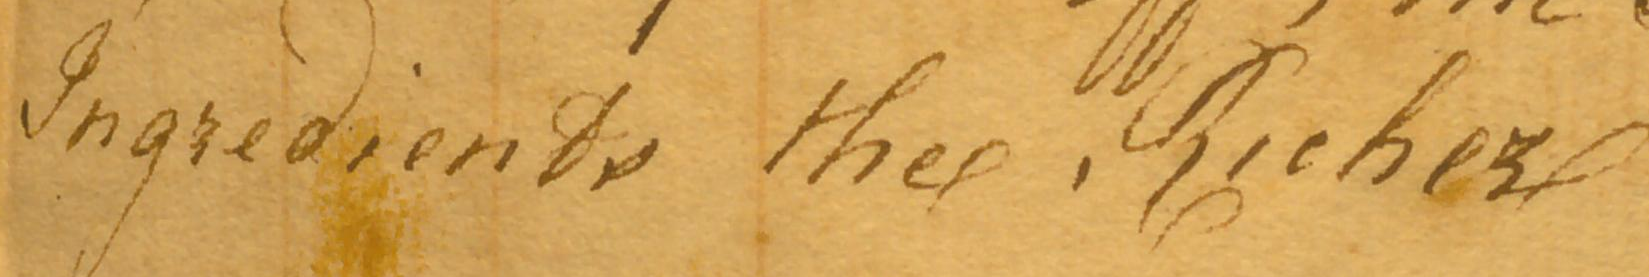Ingredients the Richer
